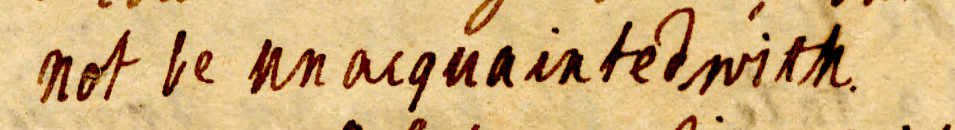not be unacquainted with.
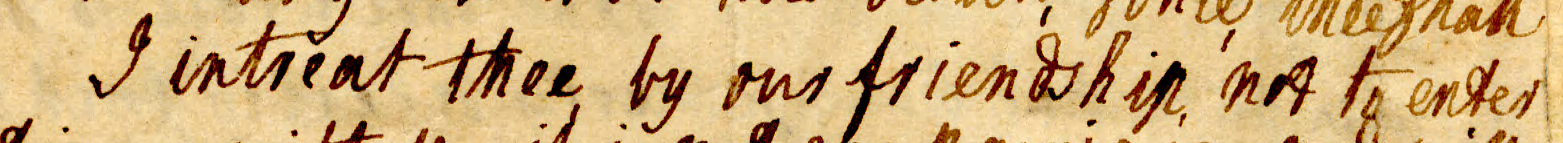I intreat thee by our friendship not to enter
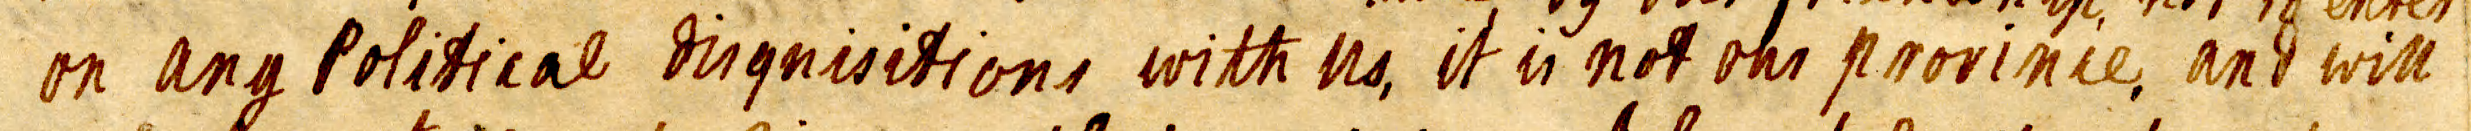on any Political disquisitions with us, it is not our province and will
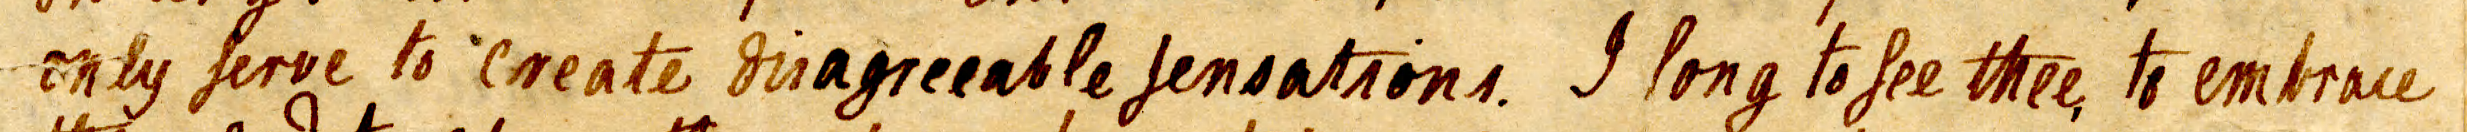only serve to create disagreeable sensations. I long to see thee, to embrace
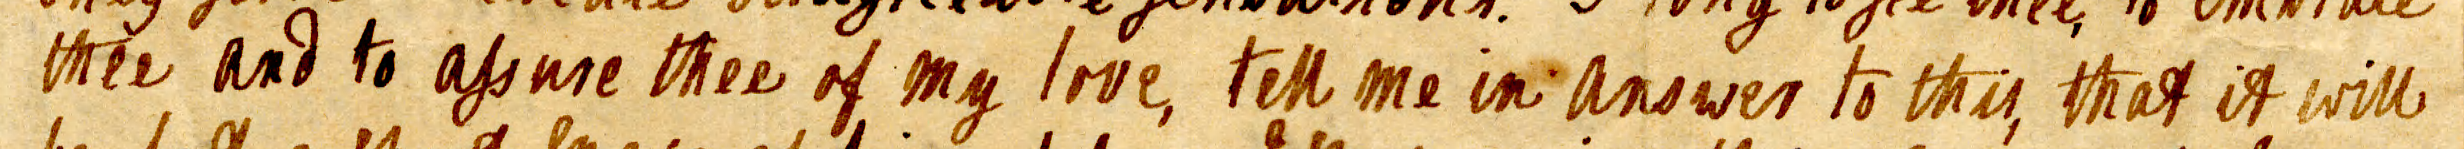thee and to assure thee of my love, tell me in answer to this, that it will
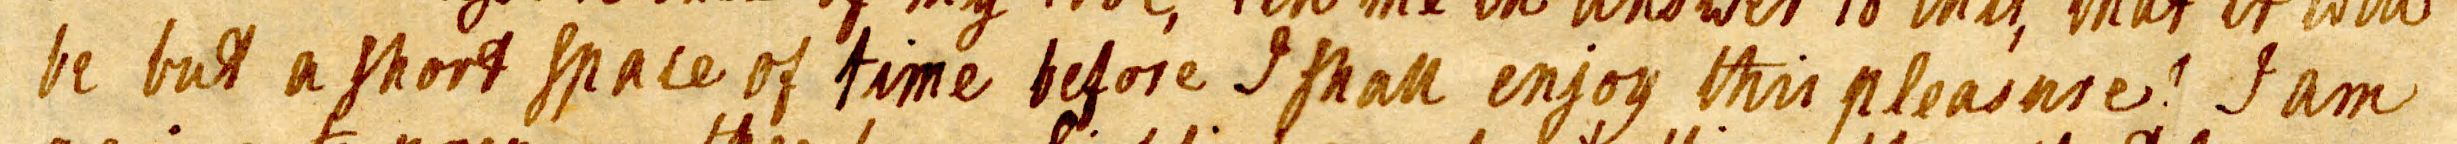be but a short space of time before I shall enjoy this pleasure! I am
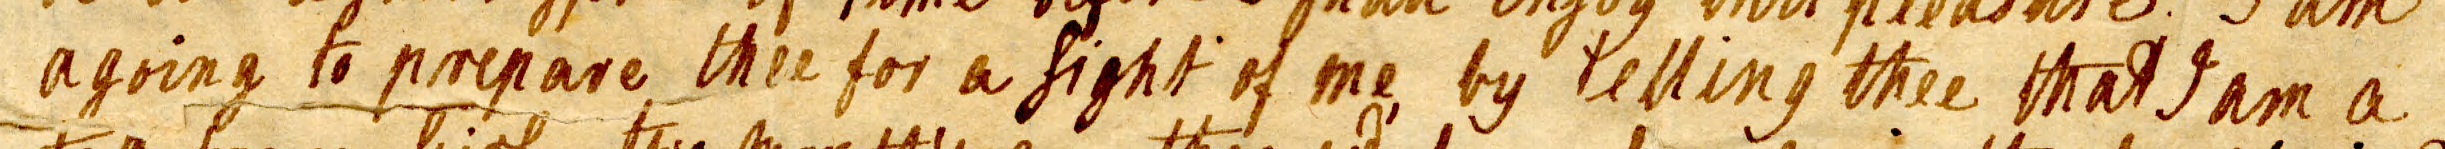agoing to prepare thee for a sight of me, by telling thee that I am a
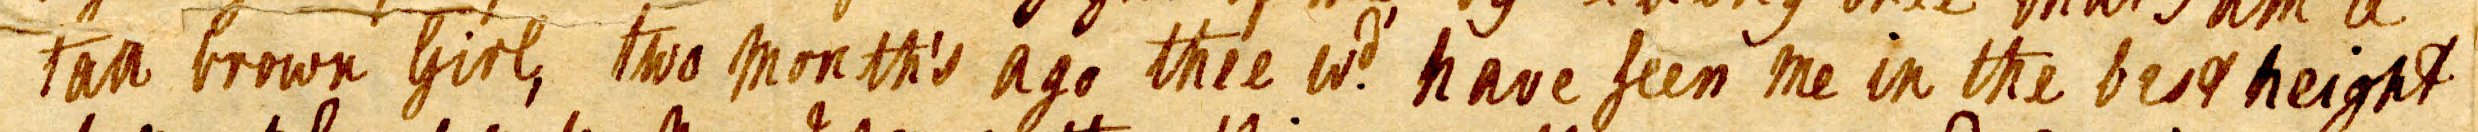tall brown Girl, two months ago thee w.^d have seen me in the best height
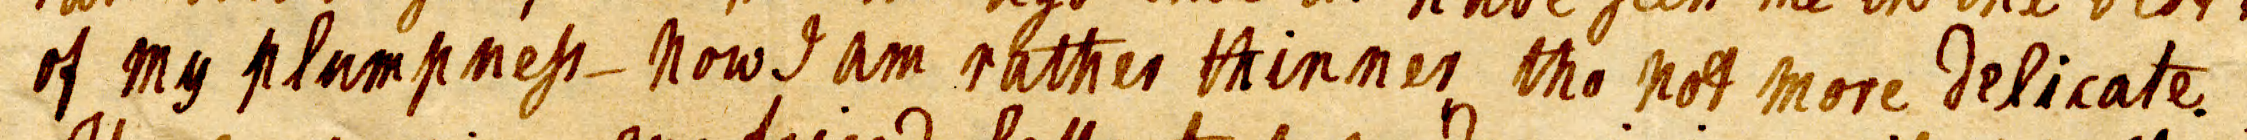of my plumpess- now I am rather thinner tho not more delicate.
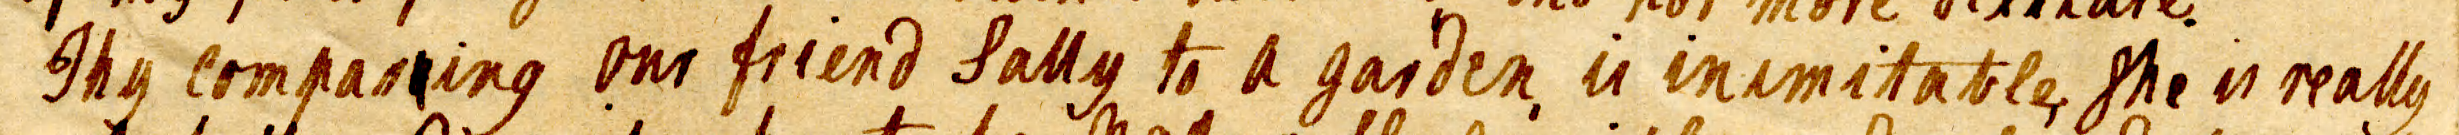Thy comparing our friend Sally to a garden is inimitable, she is really
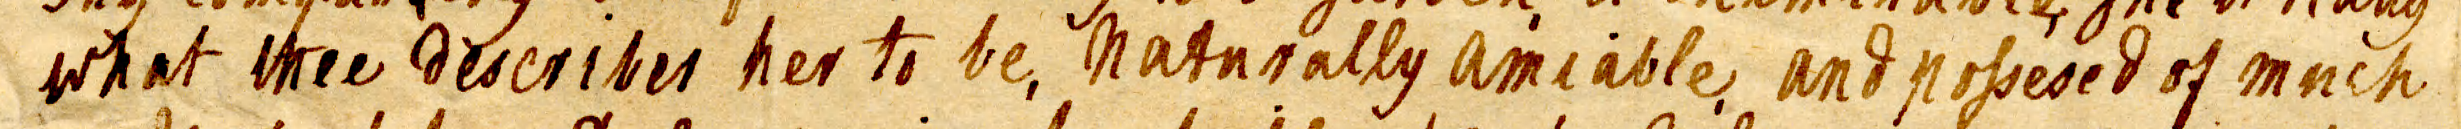what thee describes her to be, naturally amiable and possesed of much
